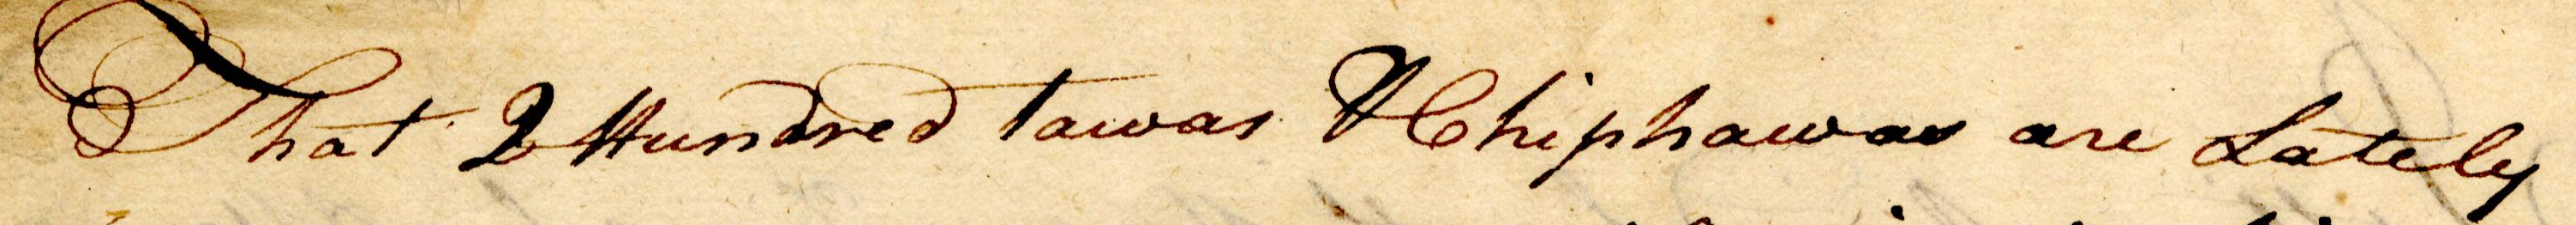That 2 Hundred tawas & Chiphawas are Lately
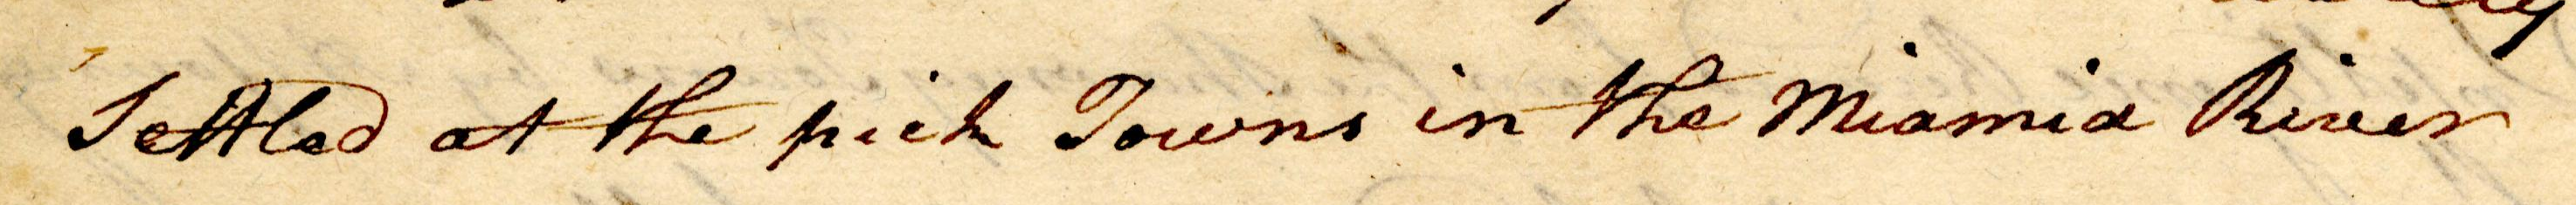settled at the pick Towns in the Miamis River
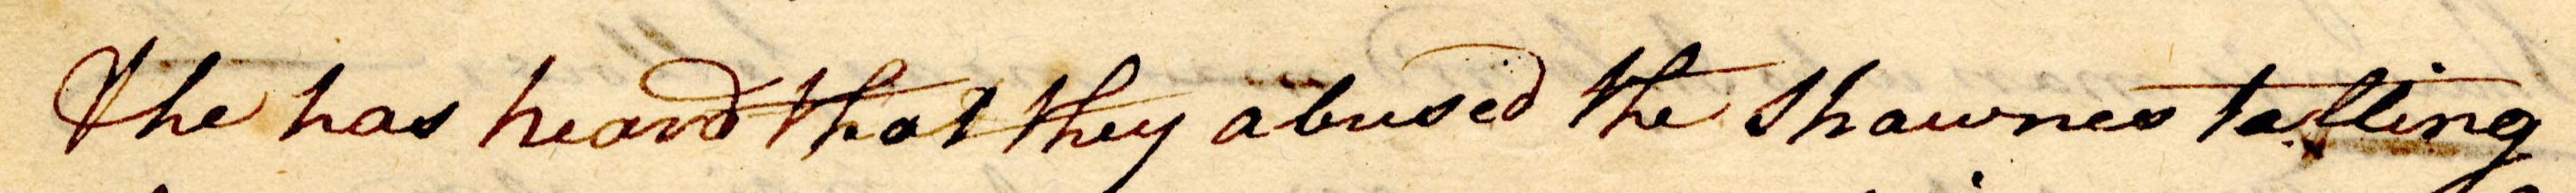& he has heard that they abused the Shawnes telling
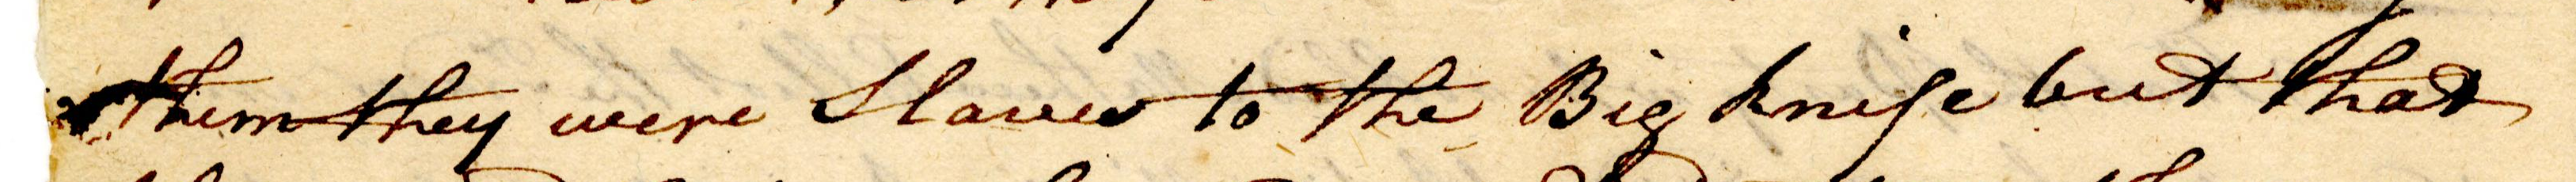them they were Slaves to the Big knife but that
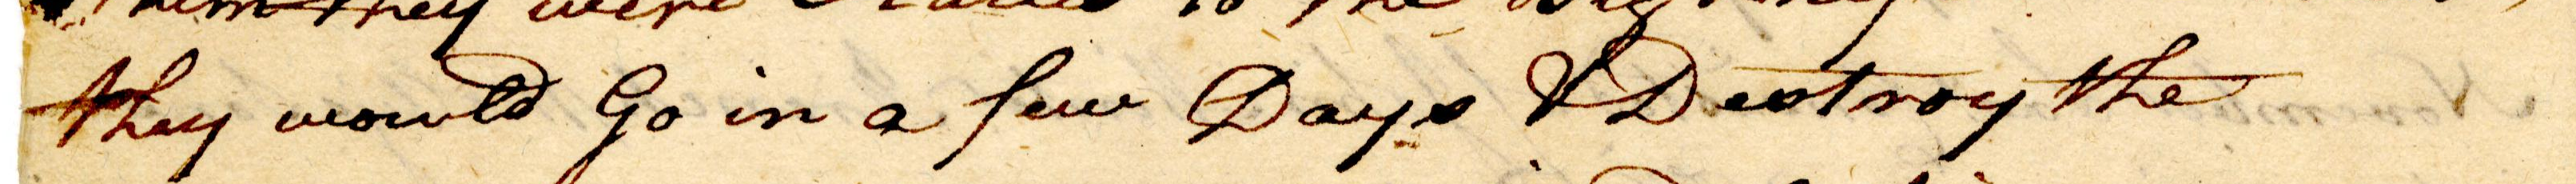they would Go in a few Days & Destroy the
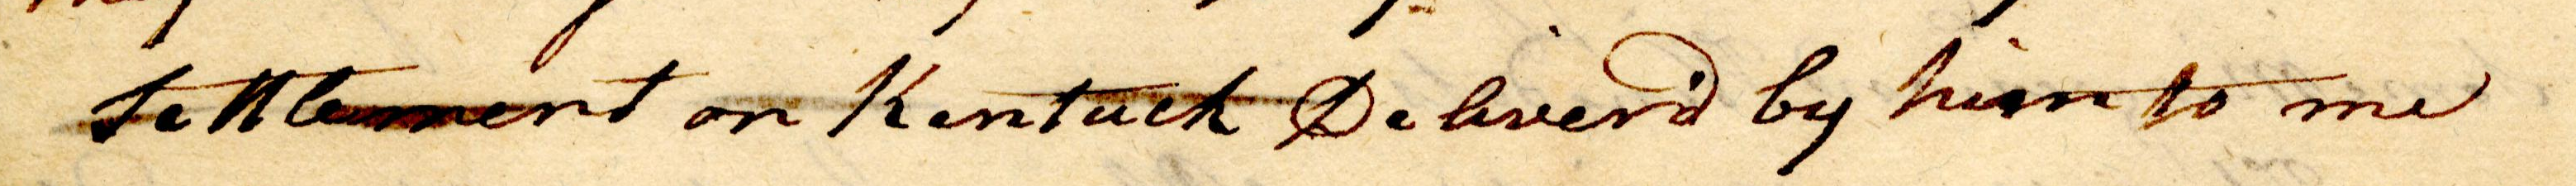settlement on Kentuck Deliver'd by him to me
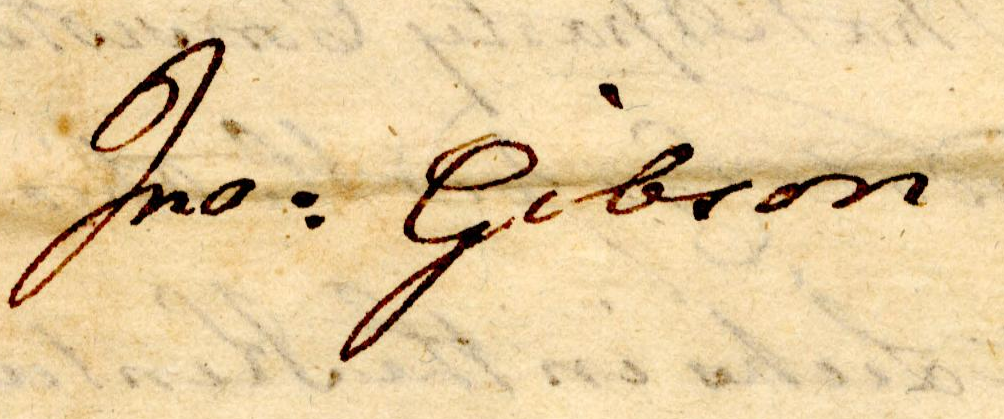Jno. Gibson
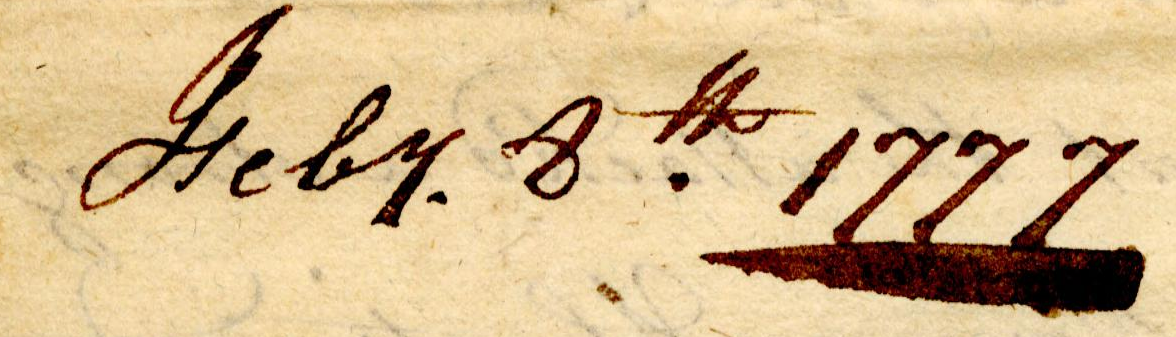Feby. 8^th. 1777
